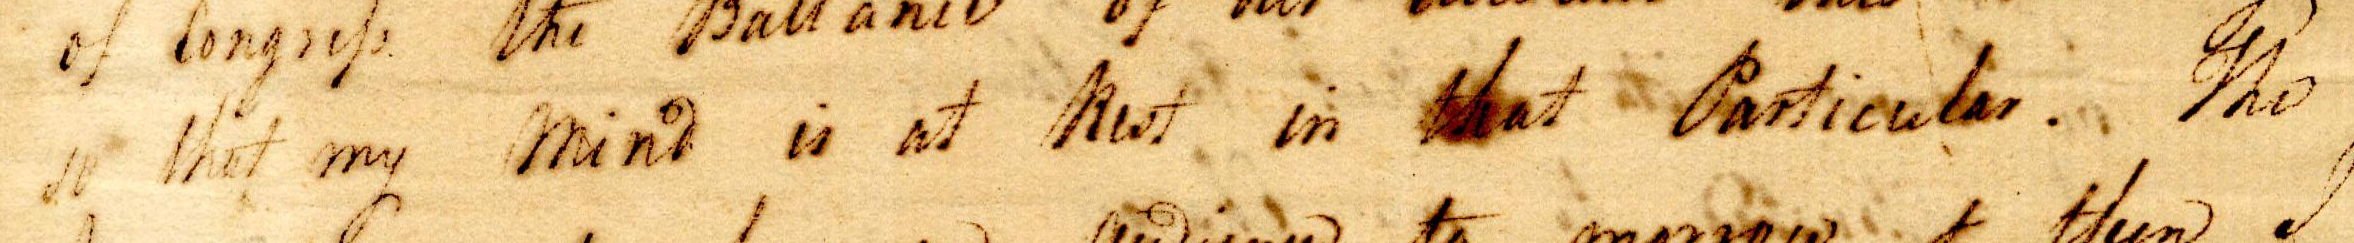so that my Mind is at Rest in that Particular. The
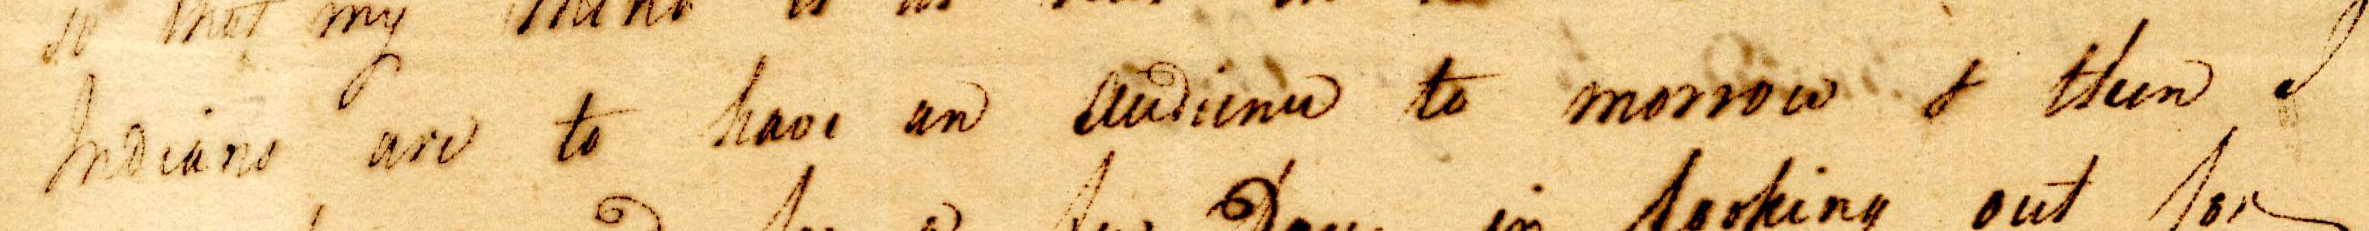Indians are to have an Audience to morrow & then I
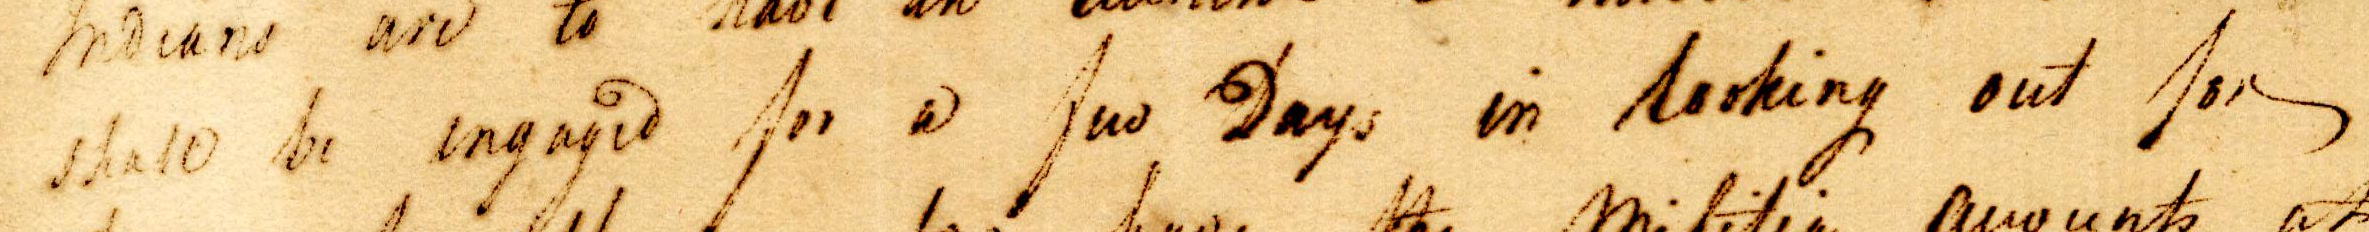shall be engaged for a few Days in looking out for
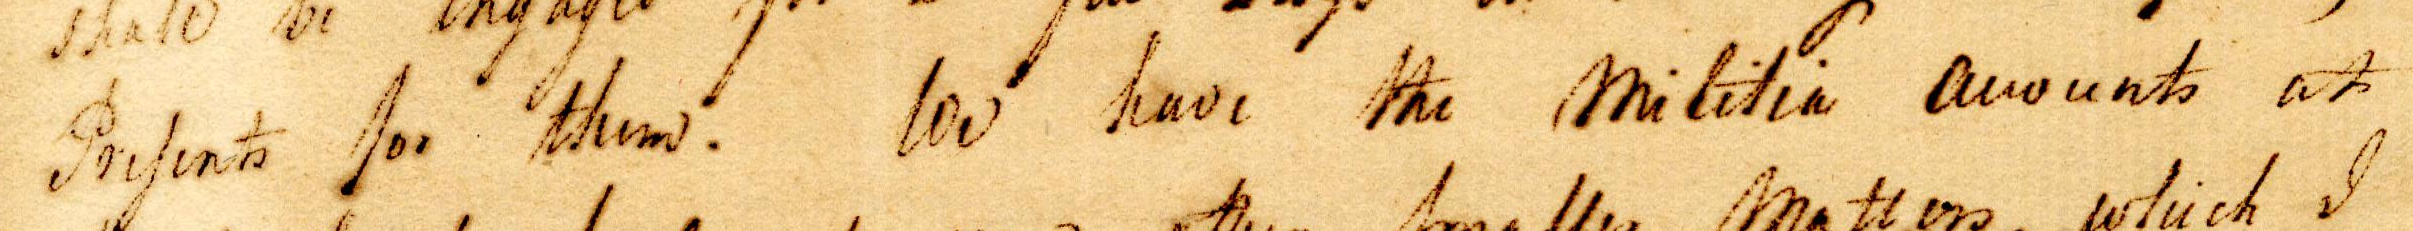Presents for them. We have the Militia Accounts at
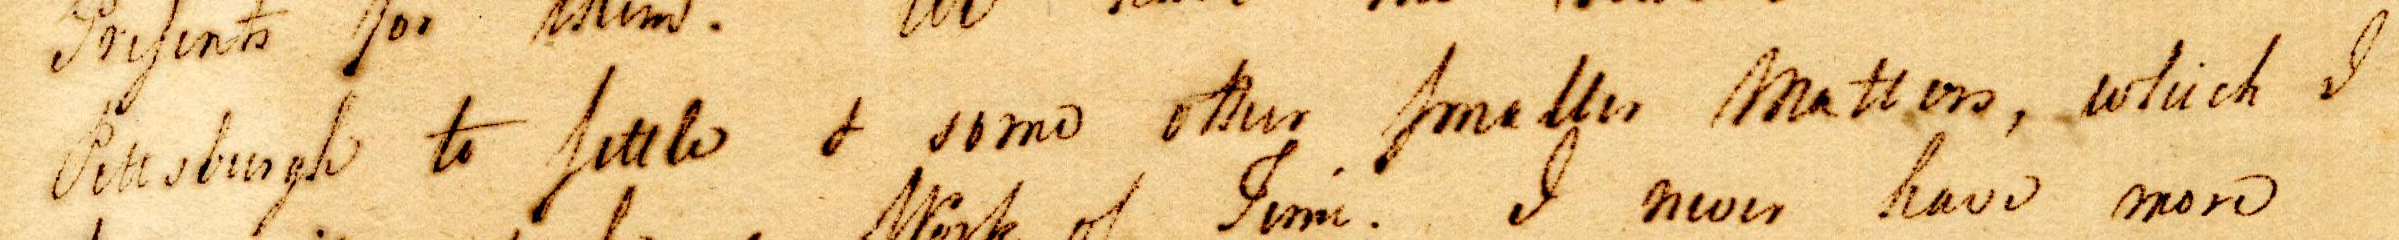Pittsburgh to settle & some other Smaller Matters, which I
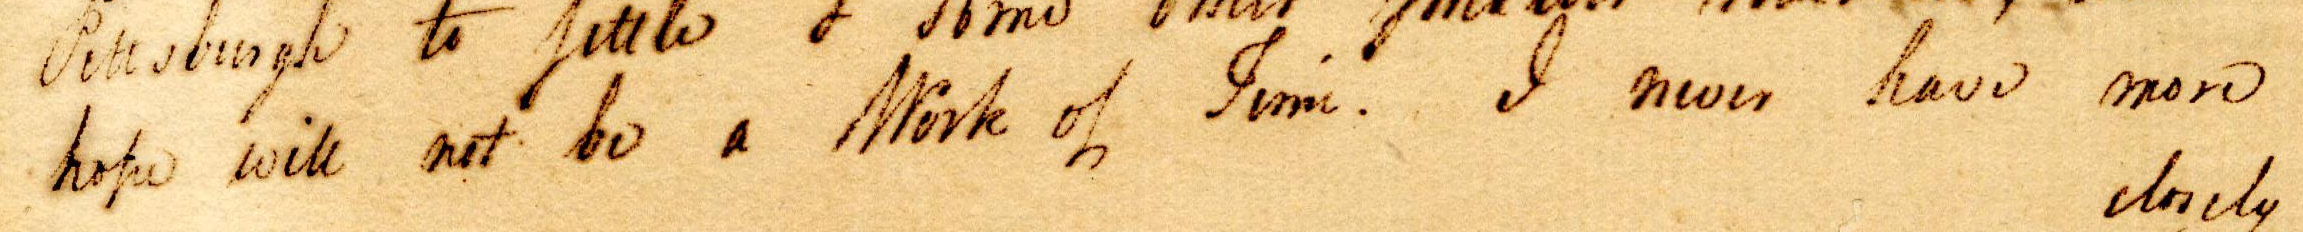hope will not be a Work of Time. I never have more
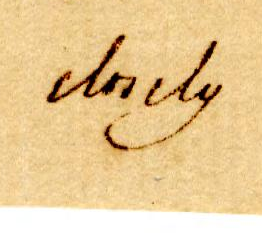closely
